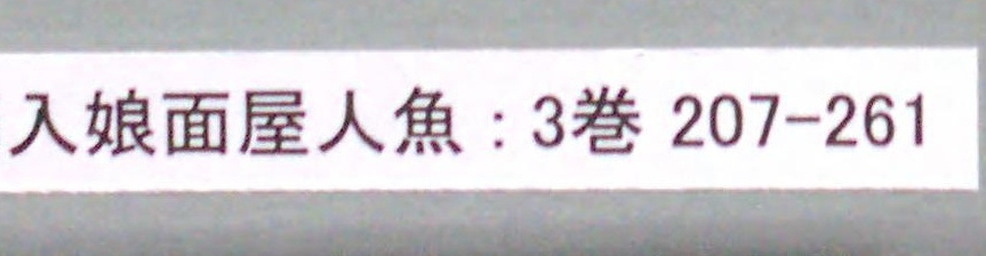箱入娘面屋人魚
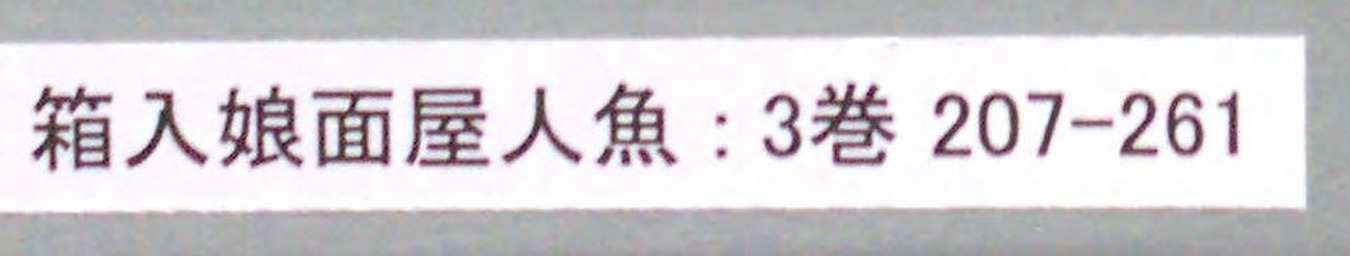箱入娘面屋人魚
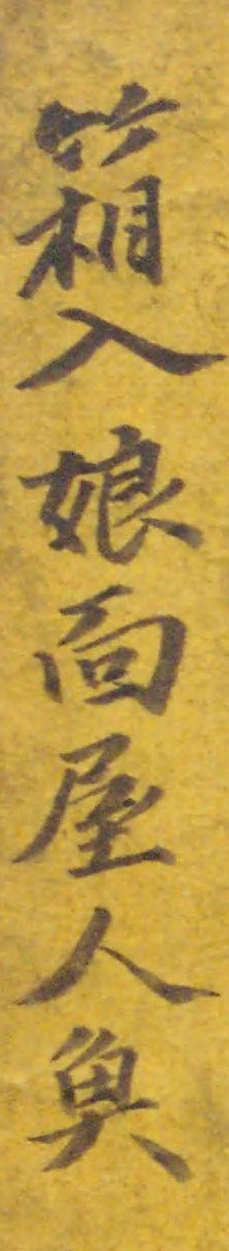箱入娘面屋人魚

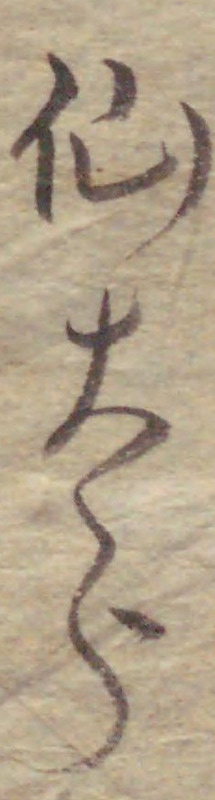仙太郎
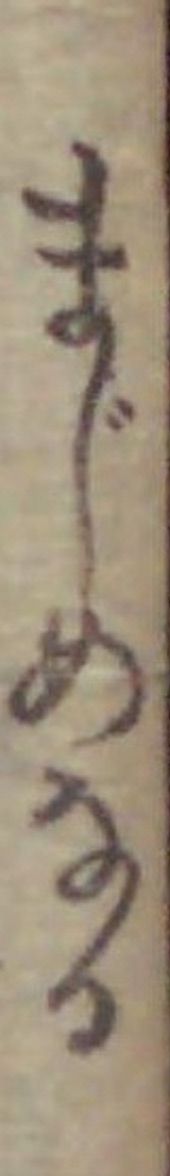まじめなる
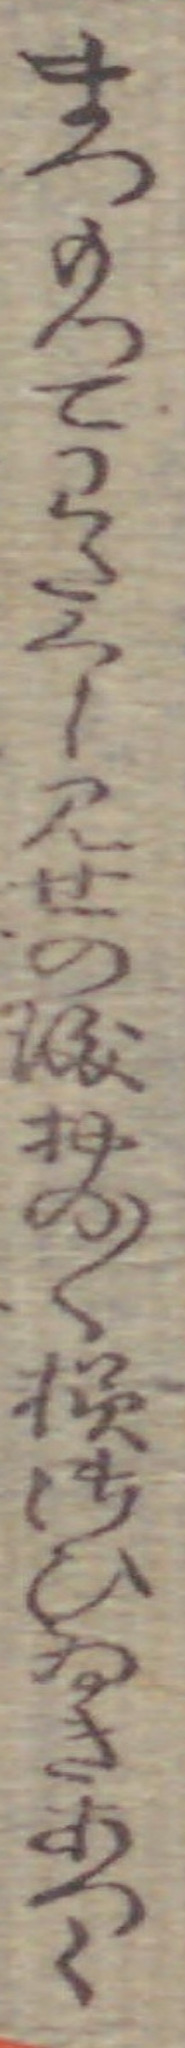まつもつてわたくしみせの儀おの〳〵様ごひゐきあつく
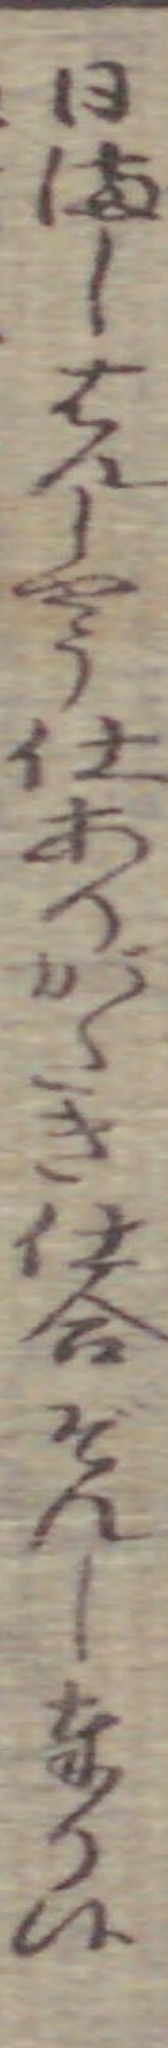日ましはんしやう仕ありがたき仕合そんし奉り候
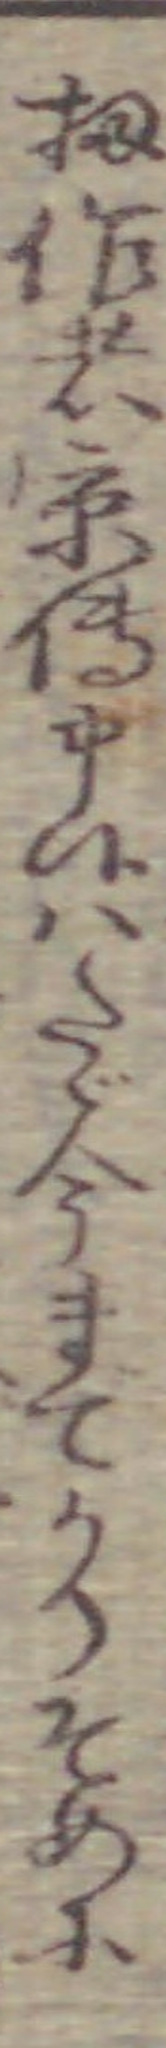扨作者京伝申候はたゞ今までかりそめに
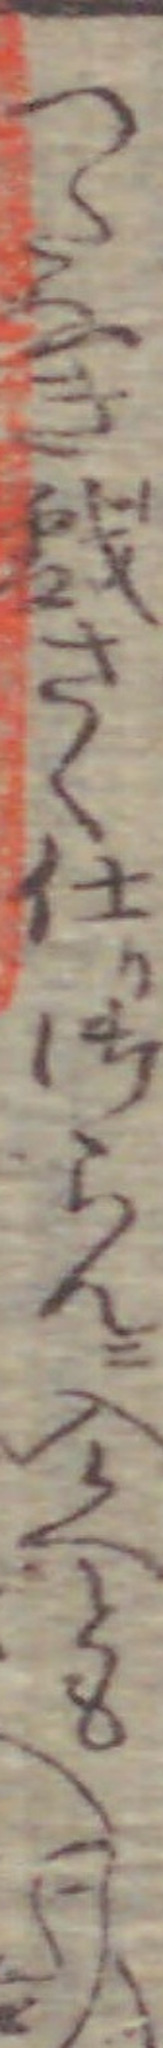つたなき戯さく仕り御らんに入候へとも
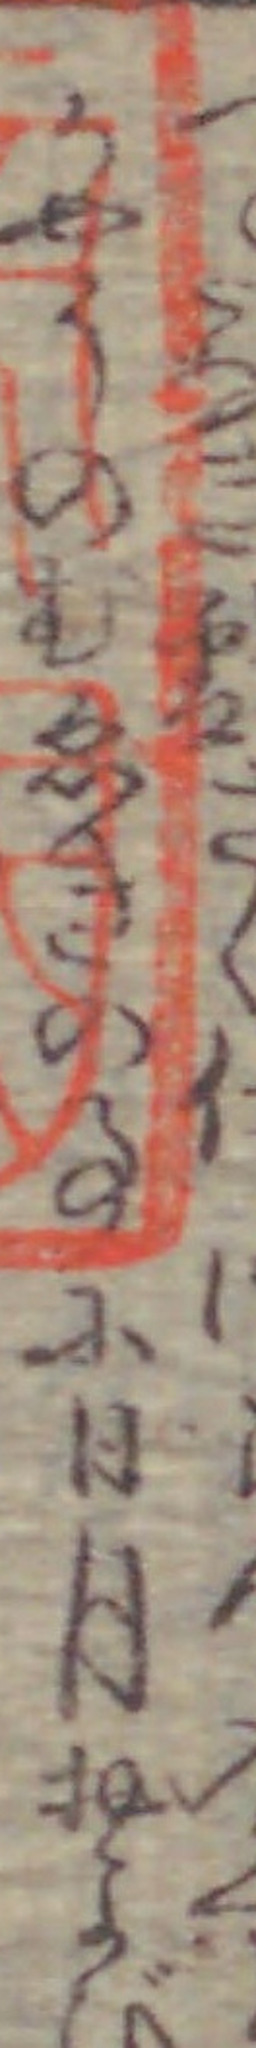かやうのむゑきの事に日月および
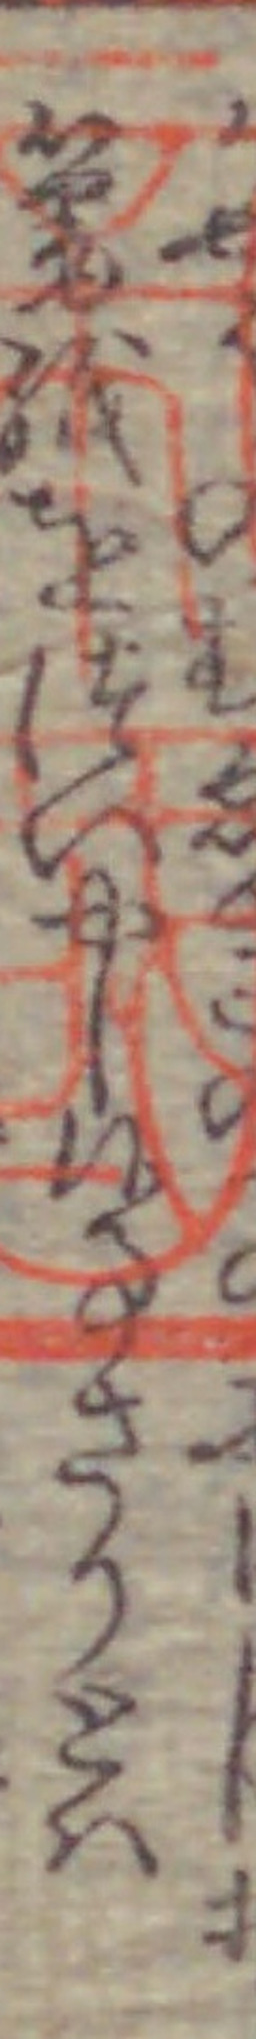筆をついやし候事さりとは
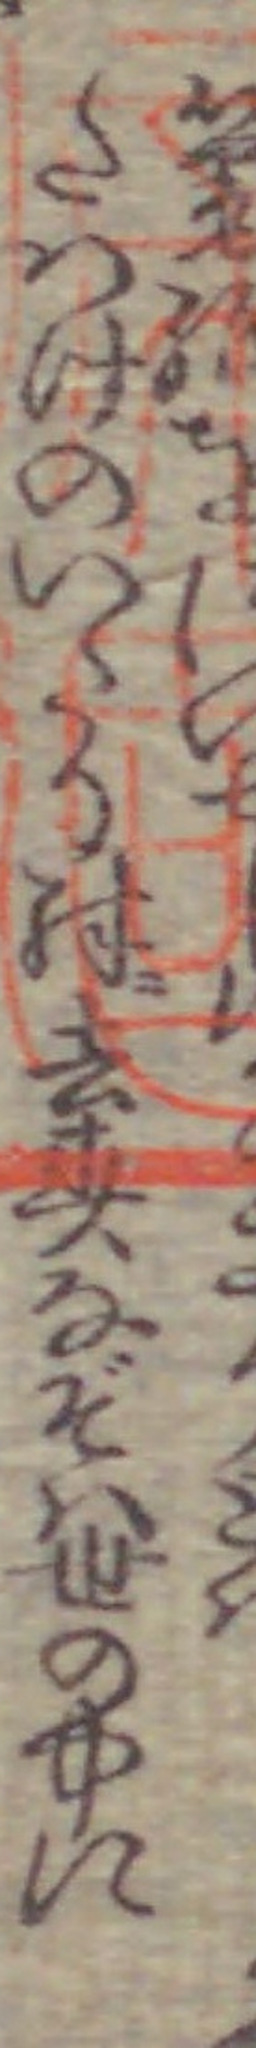たはけのいたり殊に去春なぞは世の中に
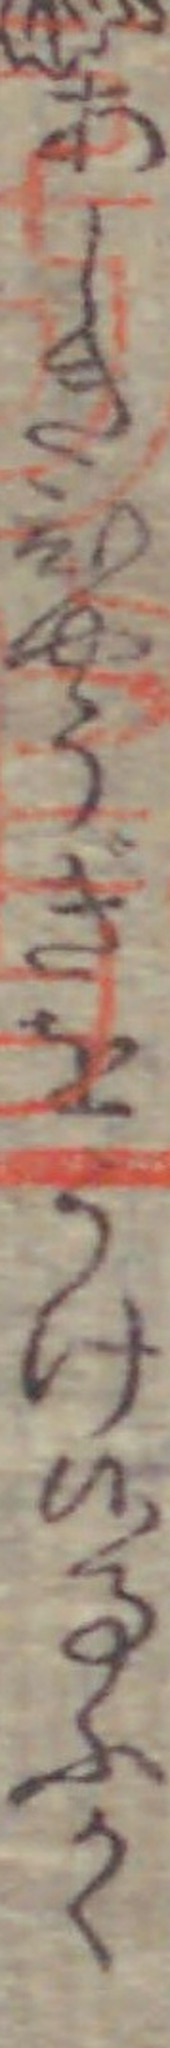あしきひやうぎをうけ候事ふかく
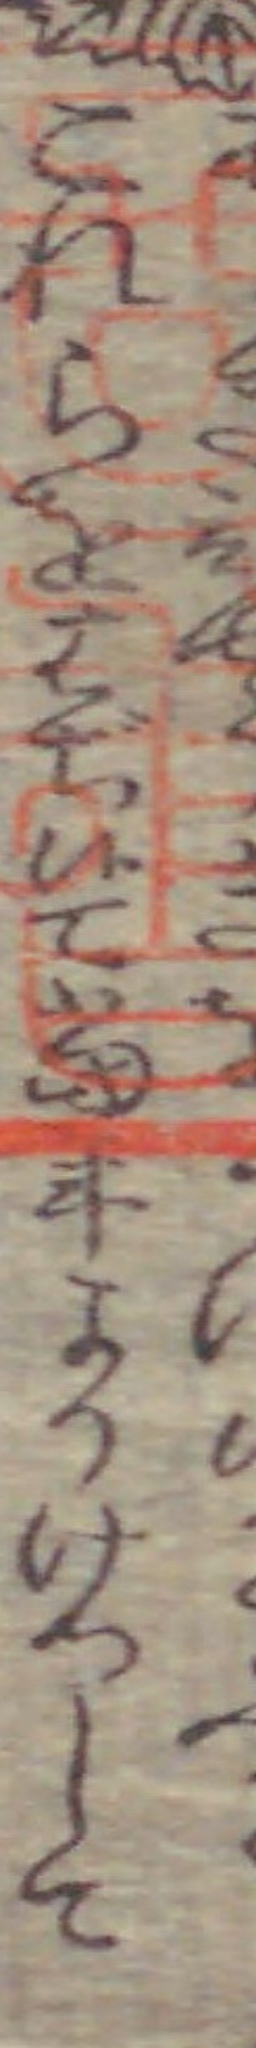これらをはぢ候て当年よりけつして
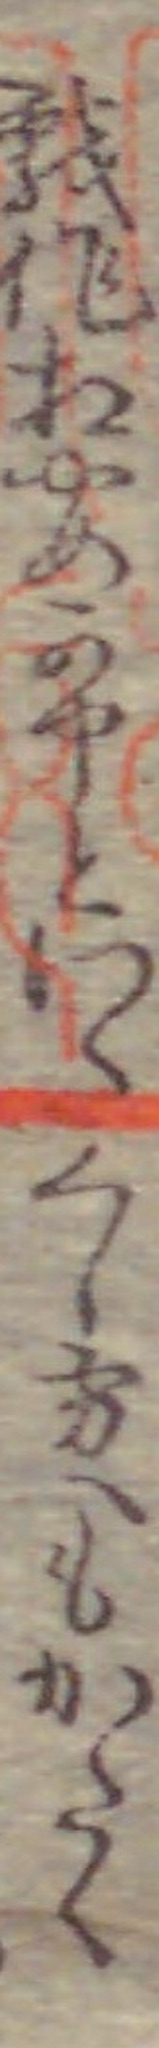戯作相やめ可申とわたくし方へもかたく
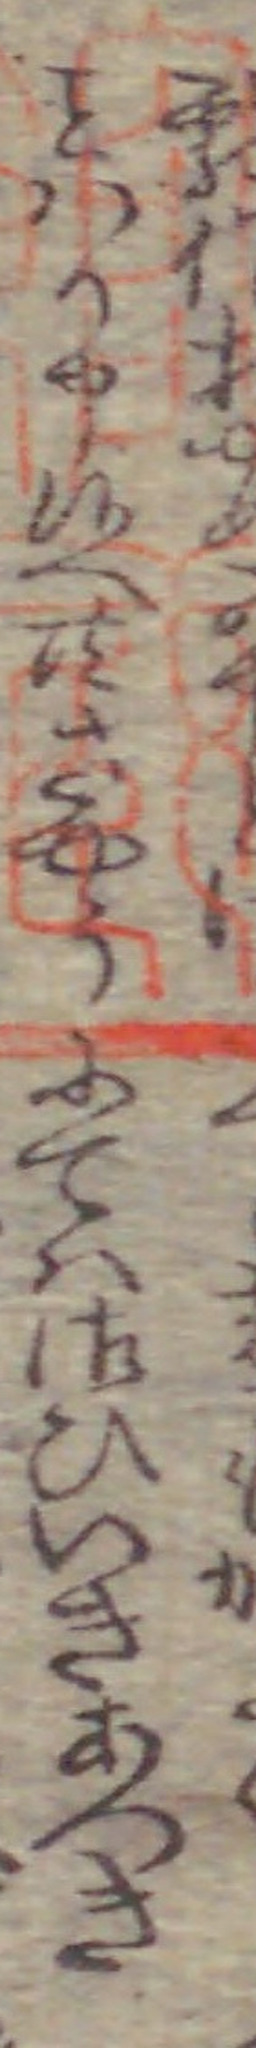ことはり申候へ共さやうにては御ひいきあつき
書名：箱入娘面屋人魚 3巻
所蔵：国立国会図書館 National Diet Library, JAPAN
